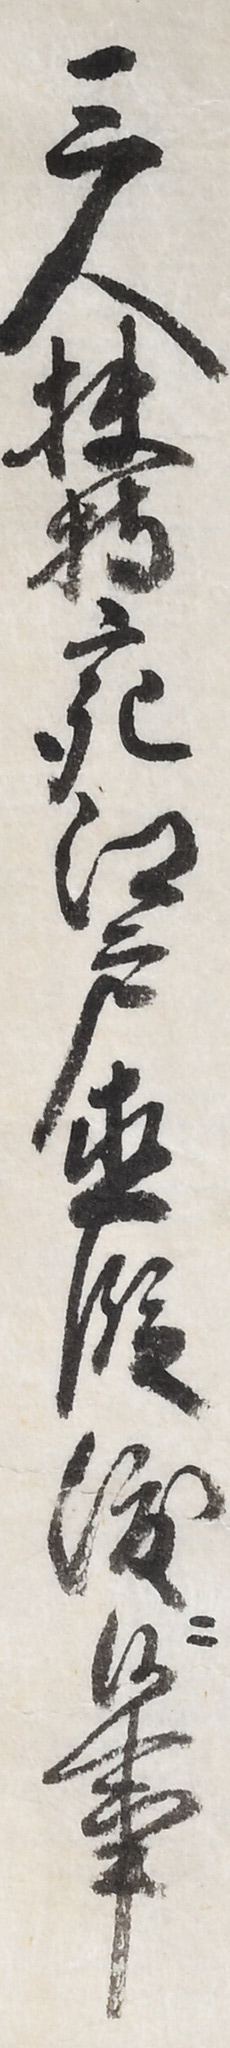三人扶持宛江戸直段渡ニ候事
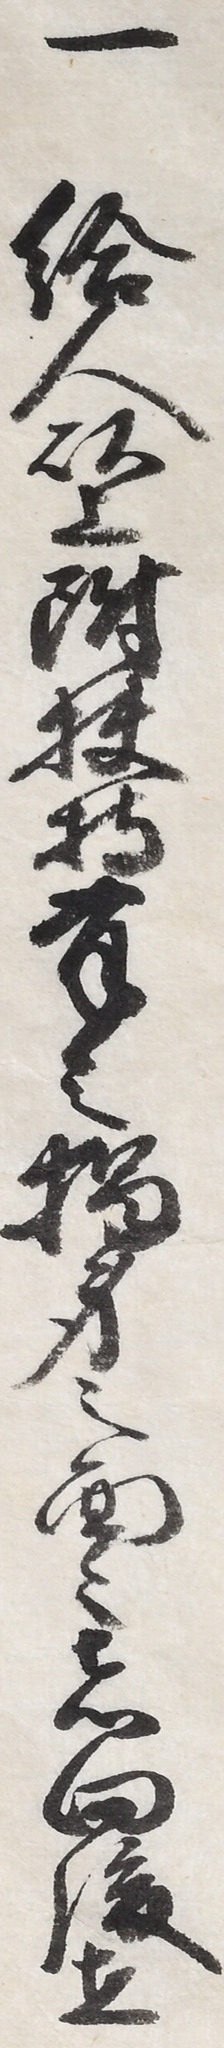一給人以上附扶持有之独身之面々は向後在
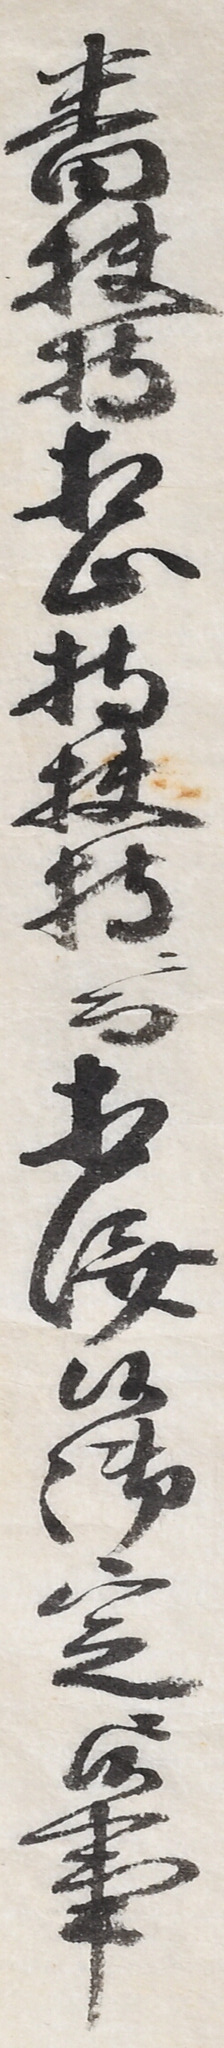番扶持相止扶持持ニ而相済候御定ニ候事
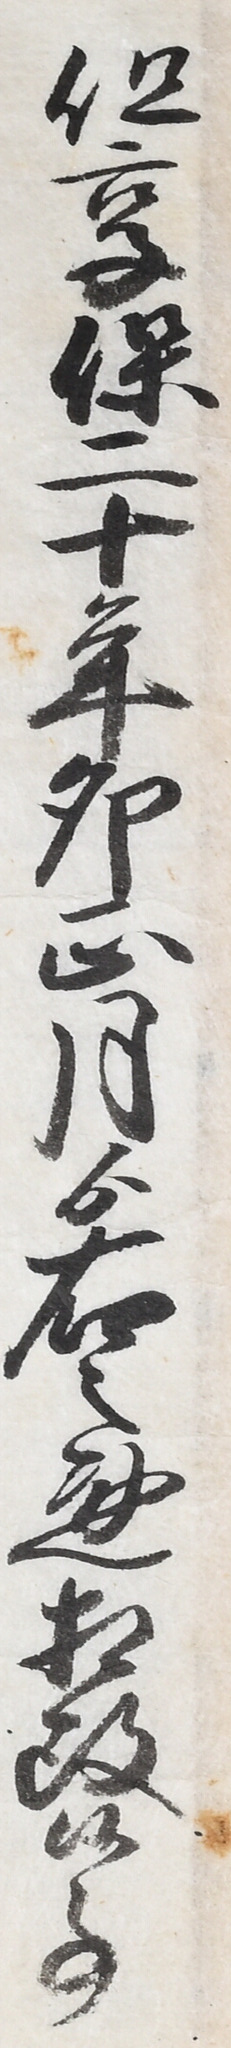但享保二十年卯正月ゟ右之通相改候事
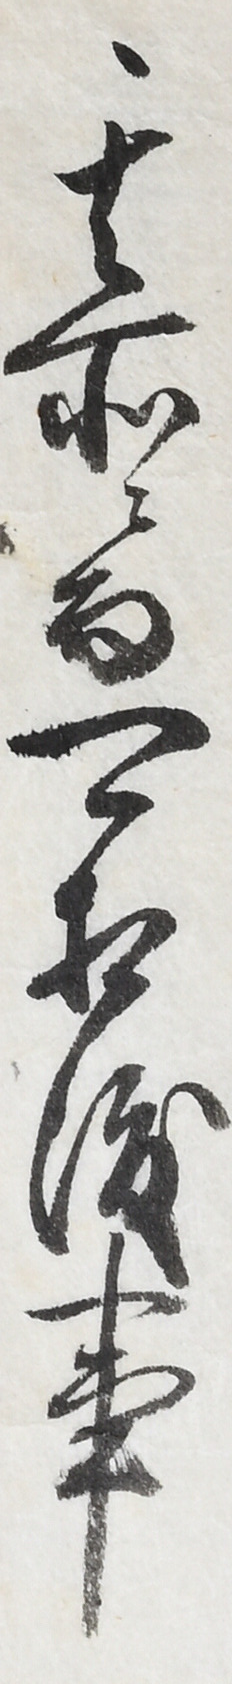其所ニ而可相渡事
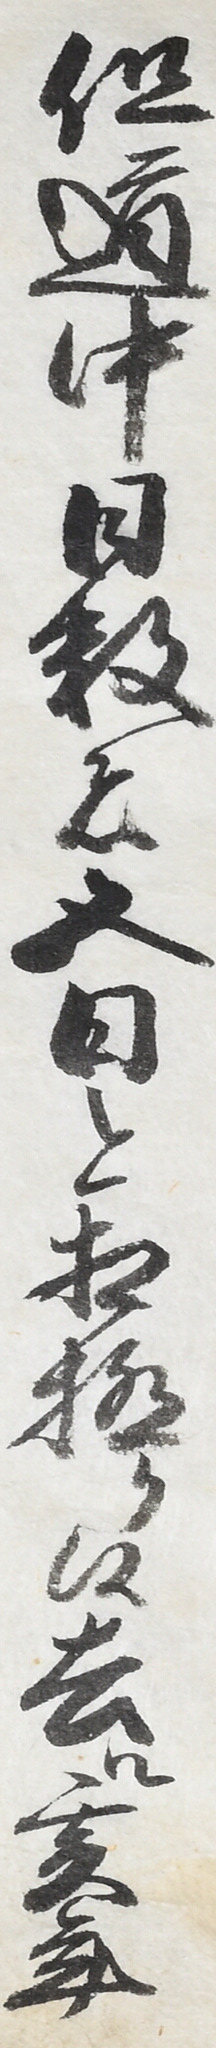但道中日数は五日と相極リ候去ル亥年
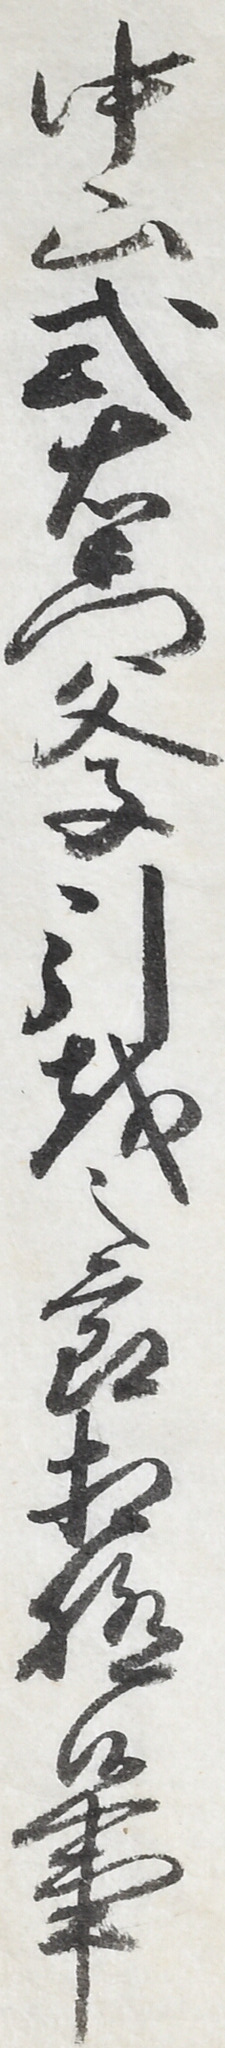中山式右衛門父子引越之節相極候事
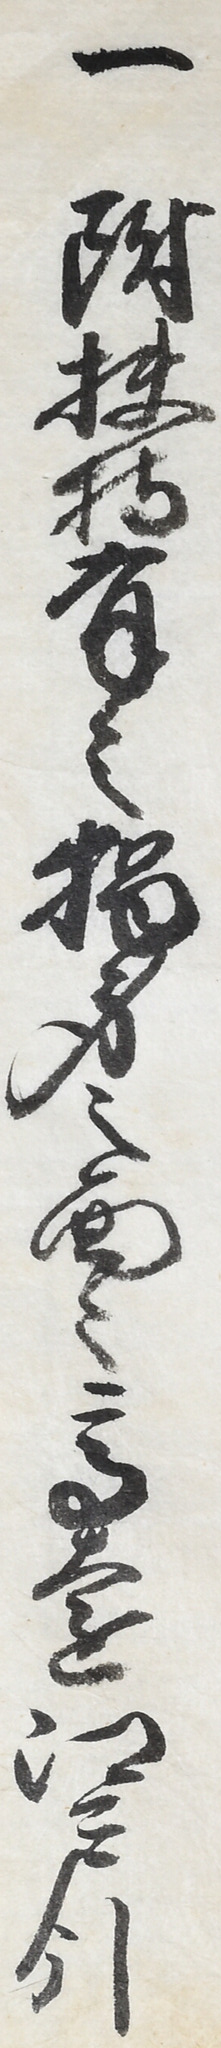一附扶持有之独身之面々高遠江戸引

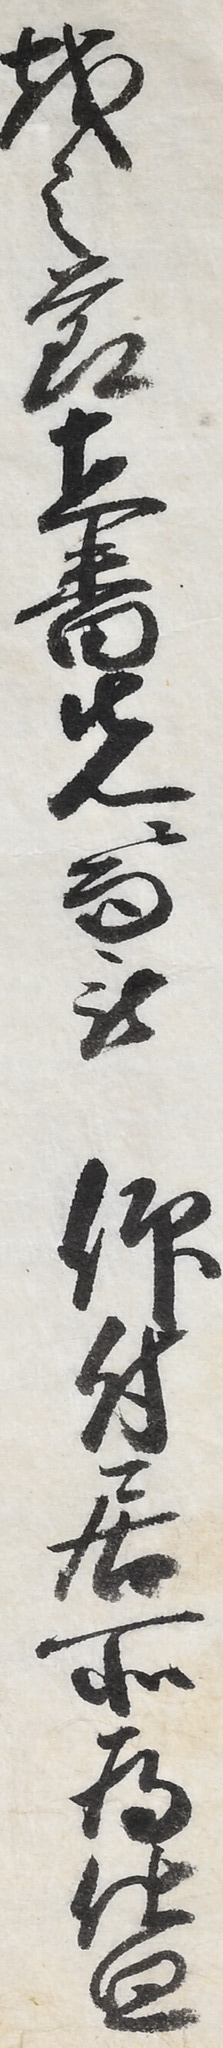越之節在番先ニ而被仰付居所為仕廻
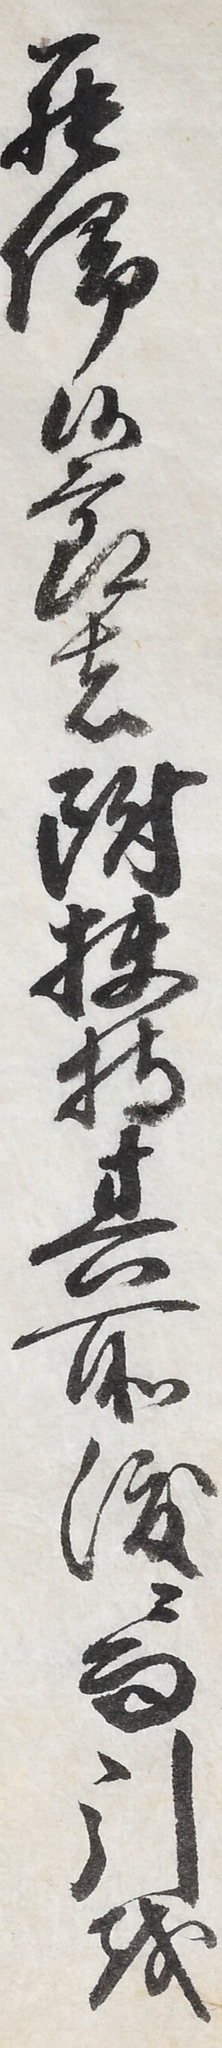罷帰候節は附扶持其所渡ニ而引越
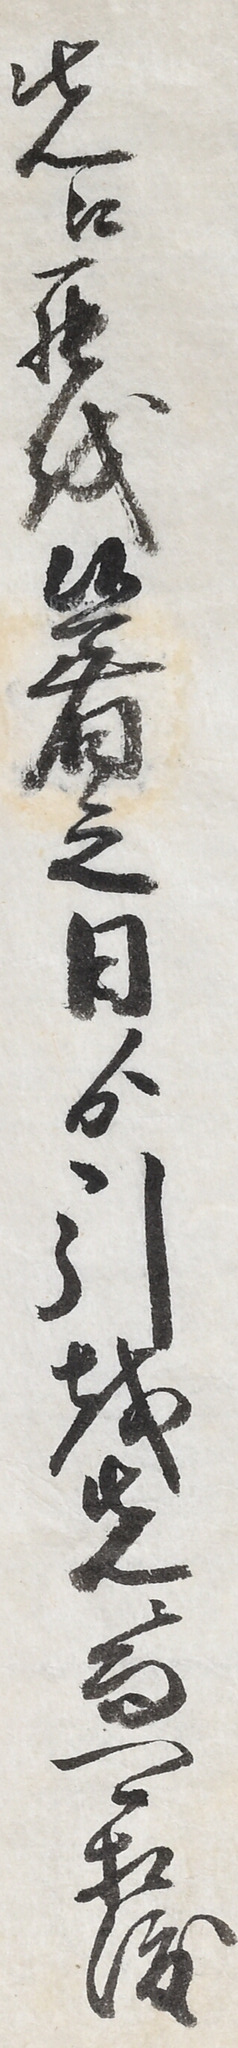先江罷越候着之日ゟ引越先ニ而可相渡
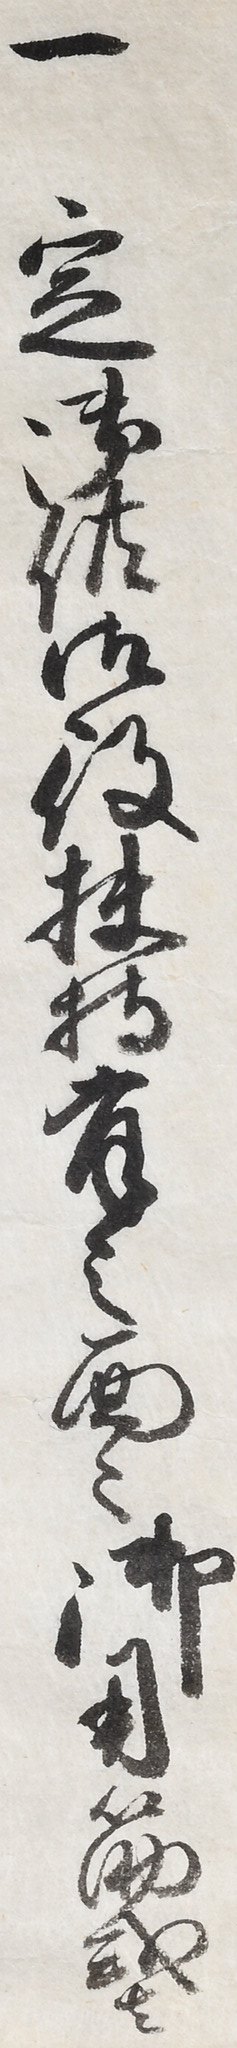一定御供御役扶持有之面々御用筋或は
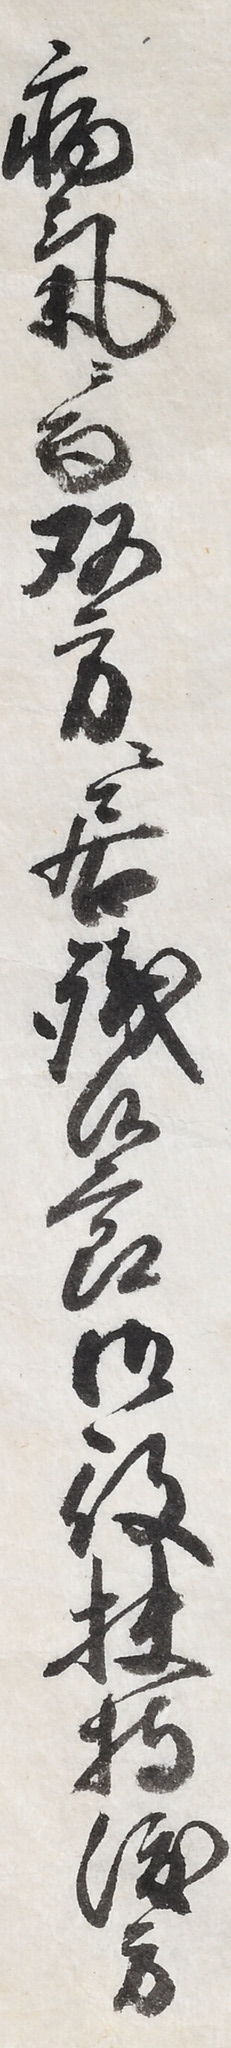病気ニ而双方ニ居残候節御役扶持渡方
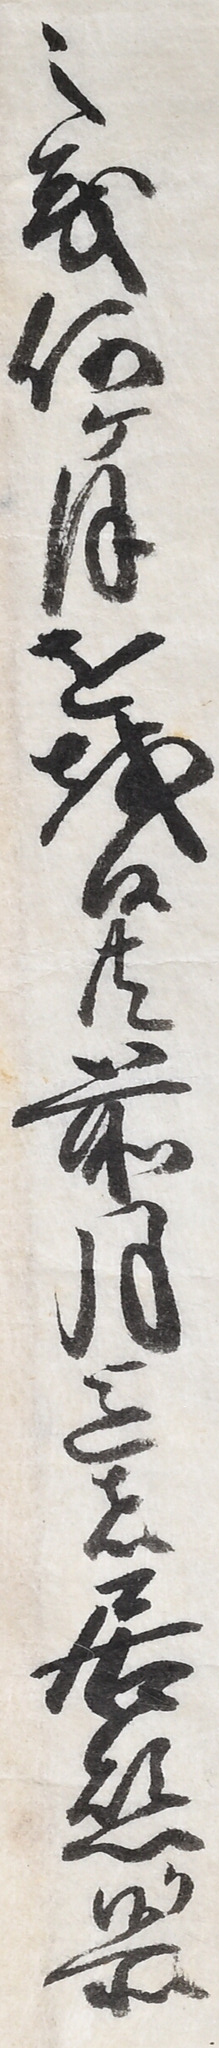之義何ヶ月を越候共前月迄は居懸リ候所
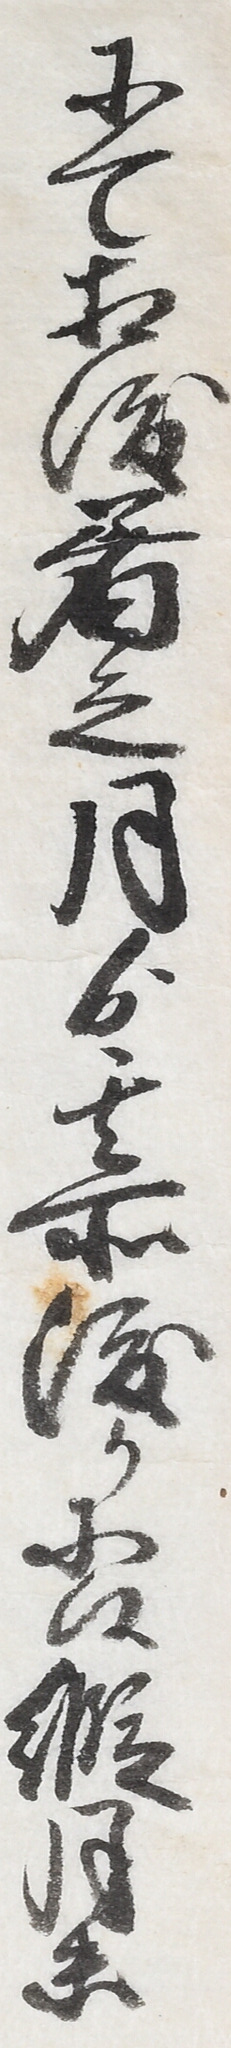にて相渡着之月ゟ其所渡リに候縦月末
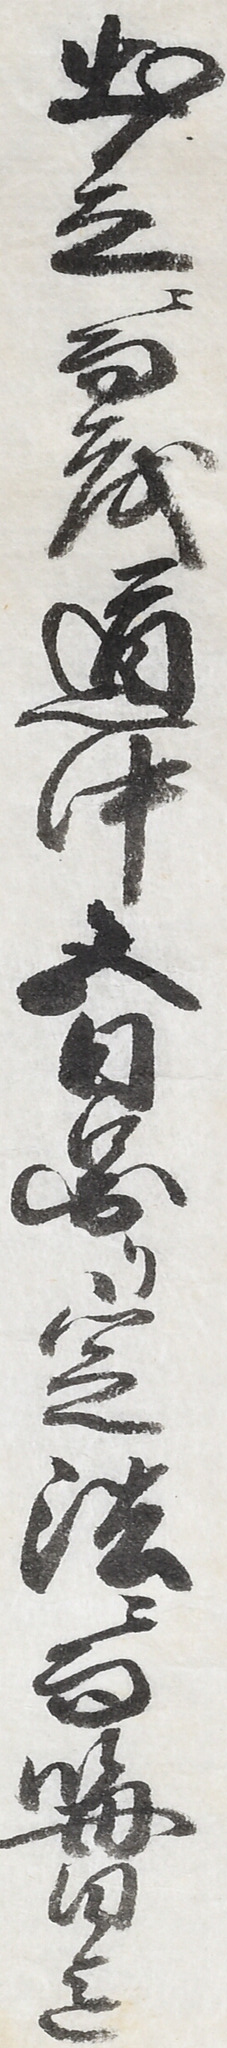出立ニ而も道中五日図り定法ニ而晦日迄
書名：御給分渡り方定追加
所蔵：伊那市立高遠町図書館・合同会社AMANE
